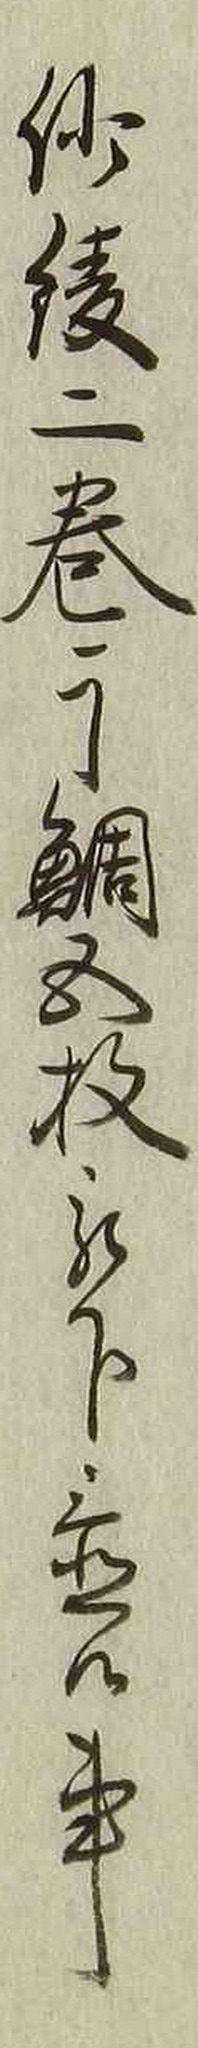紗綾二巻干鯛五枚被下置候事
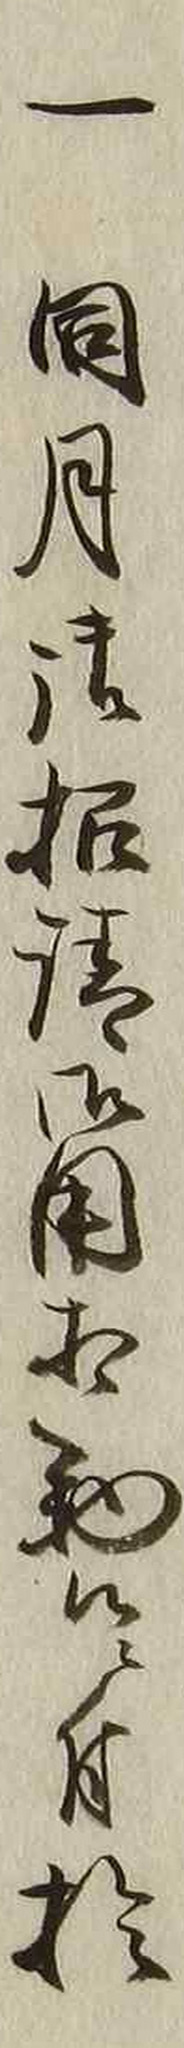一同月御招請御用相勤候ニ付於
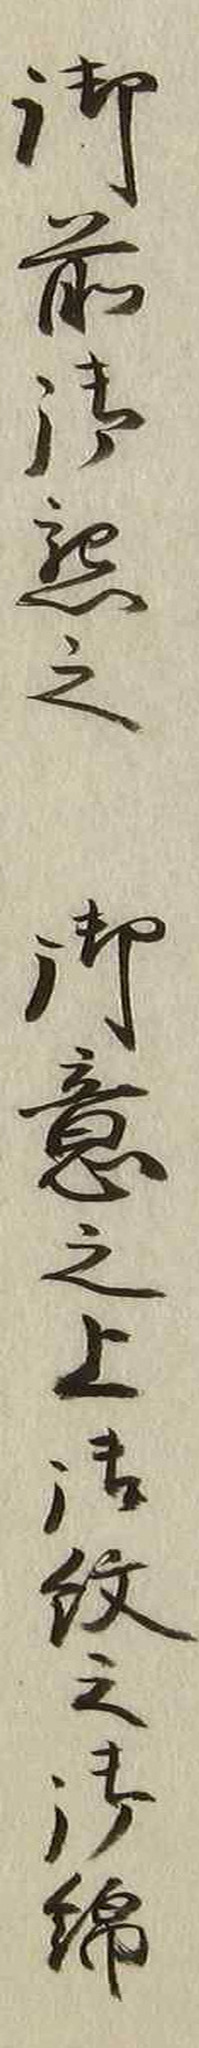御前御懇之御意之上御紋之御綿
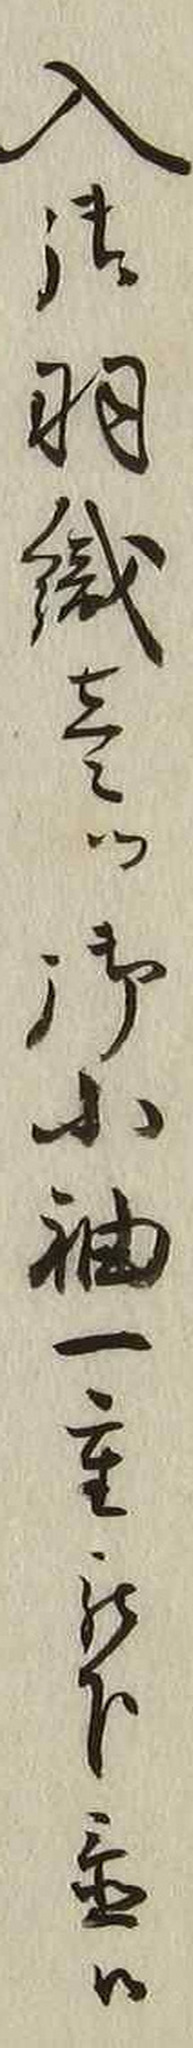入御羽織壱ツ御小袖一重被下置候
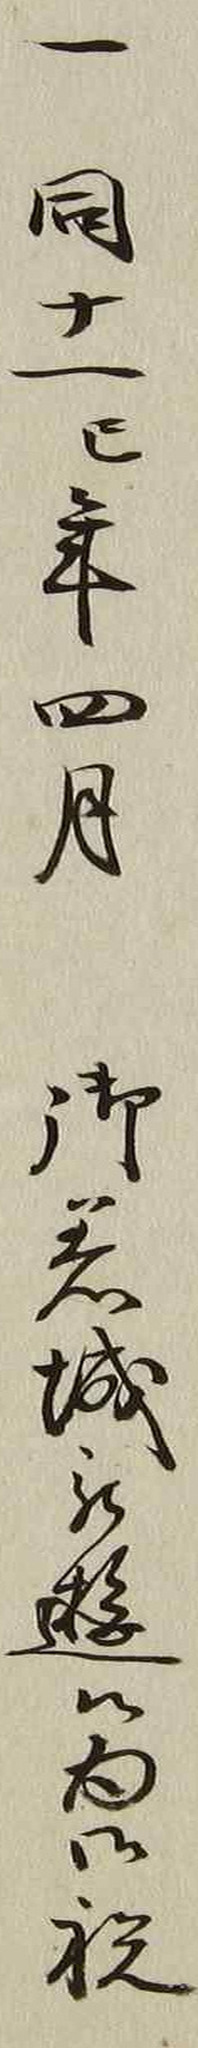一同十一巳年四月御着城被遊候為御祝
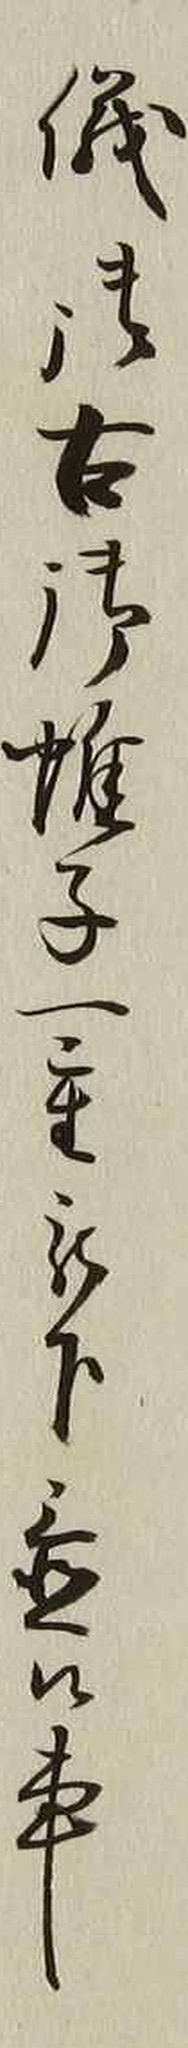儀御古御帷子一重被下置候事
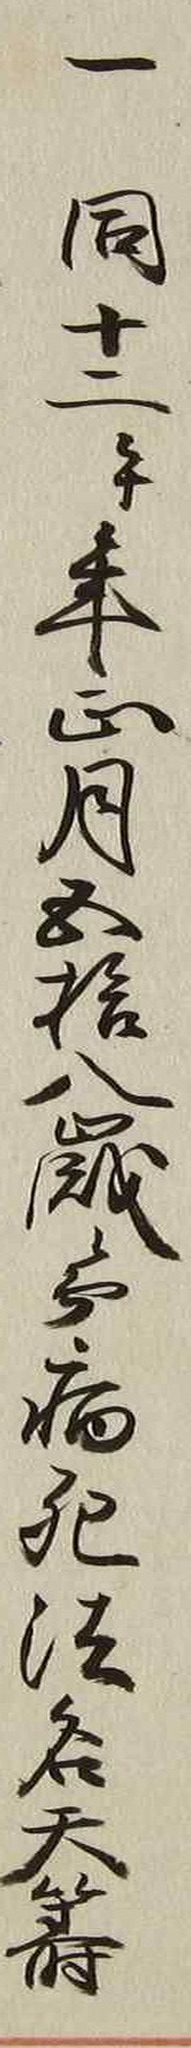一同十二午年正月五拾八歳ニ而病死法名天籌
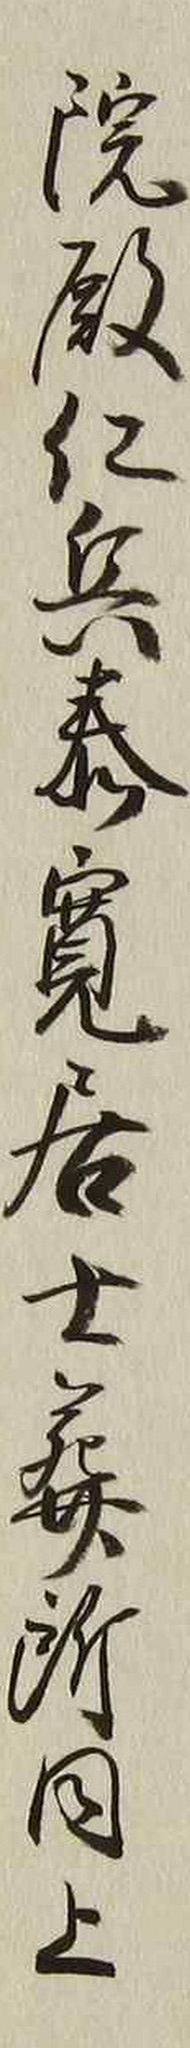院殿仁兵泰寛居士葬所同上
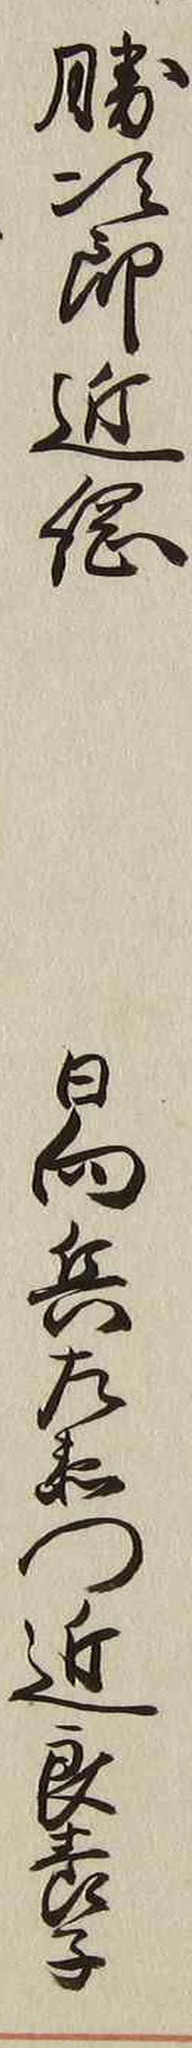勝次郎近綱日向兵左衛門近良養子
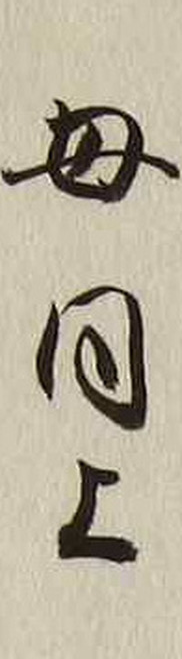母同上
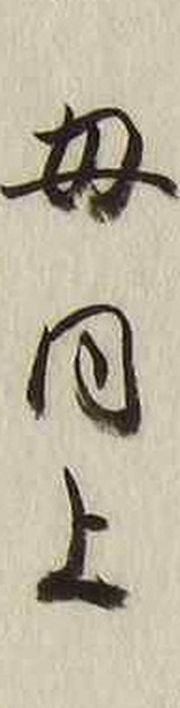母同上
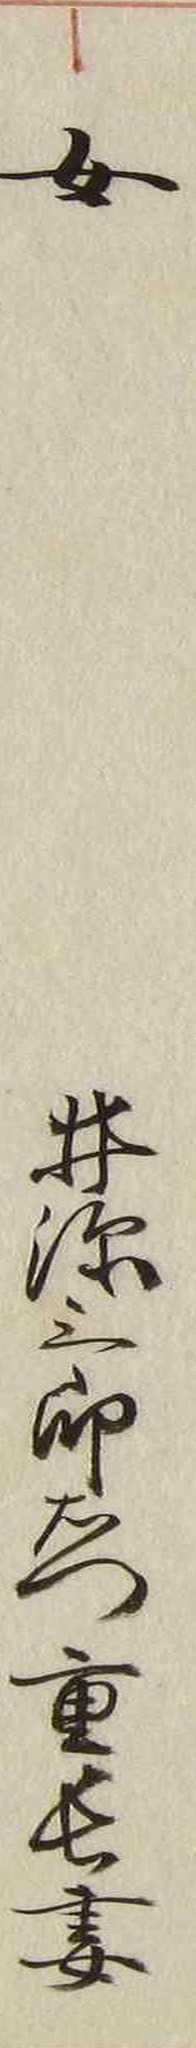女井深三郎右門重長妻
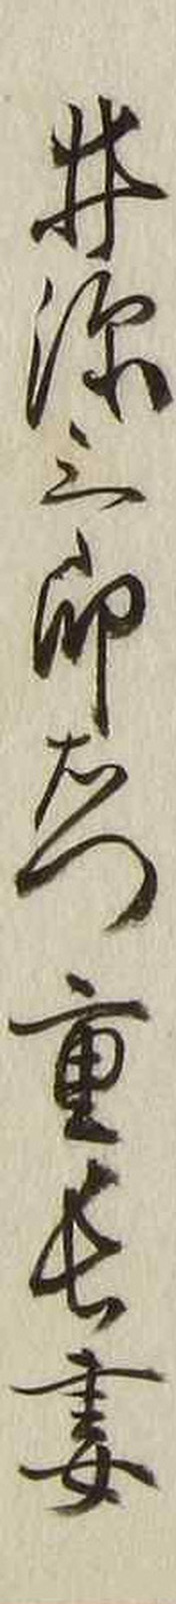女井深三郎右門重長妻
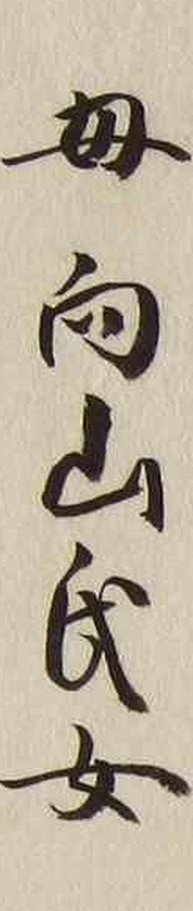母向山氏女

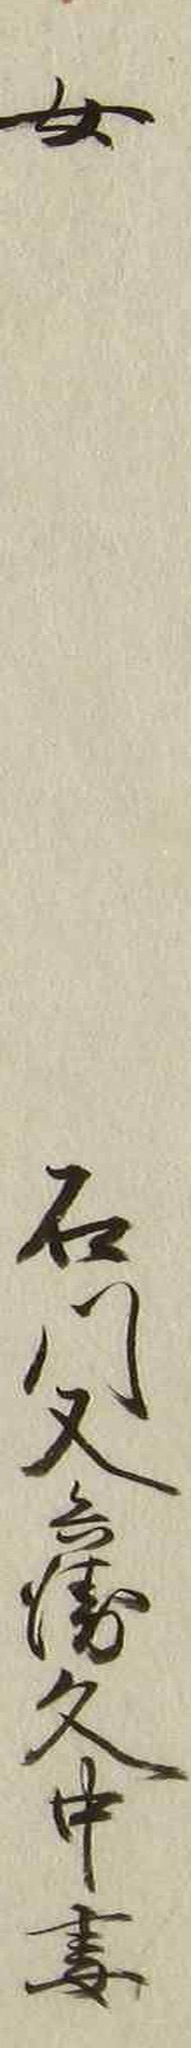女石川又兵衛久中妻
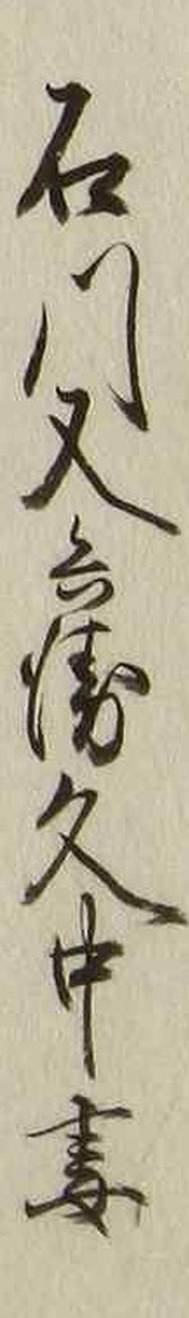女石川又兵衛久中妻
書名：諸士系譜　巻之15　い之部15
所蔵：会津若松市立会津図書館
